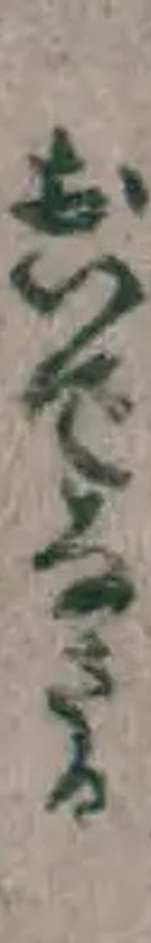おいでなさる
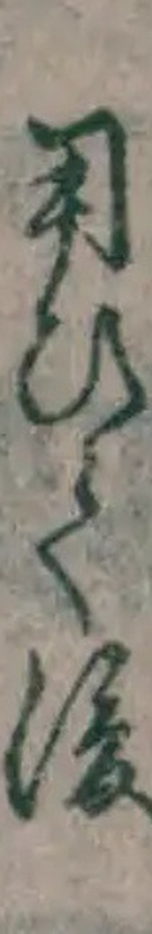用ひて後
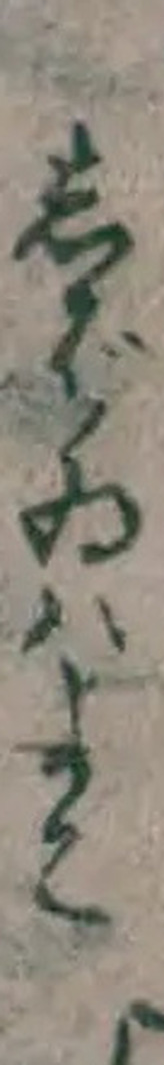しばゐはよこ
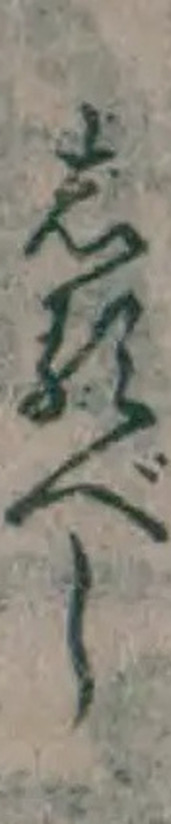しるべし
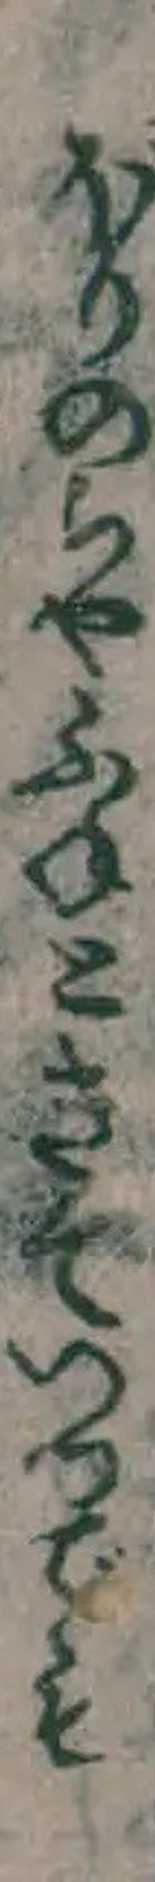ほりのちやふねときていつでも
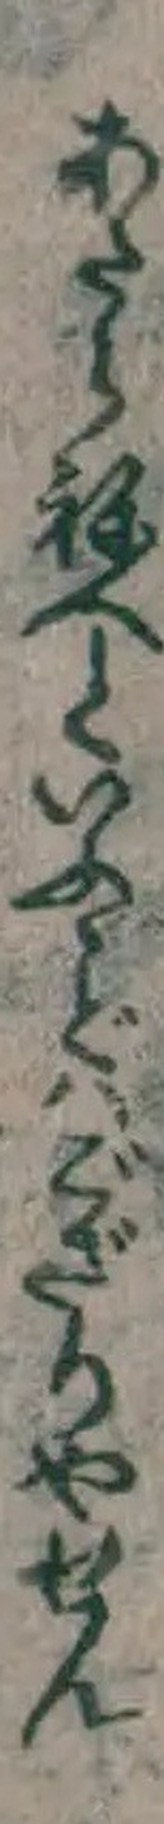あたらねへといふことはござりやせん

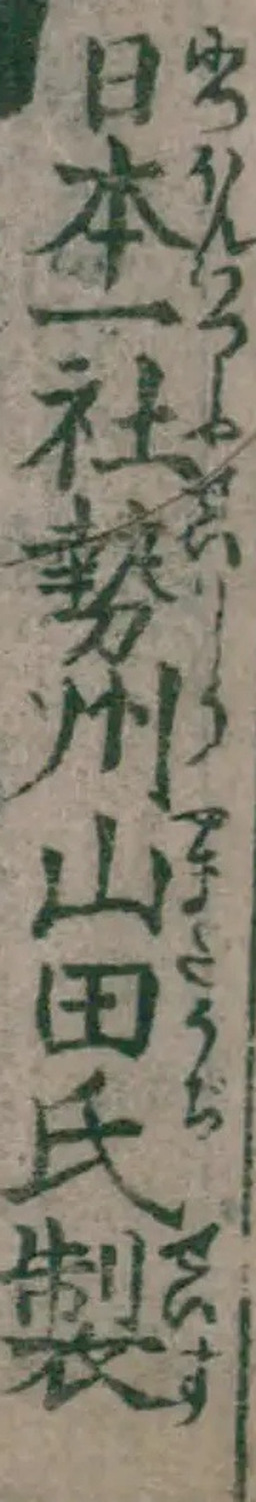日本一社勢州山田氏製
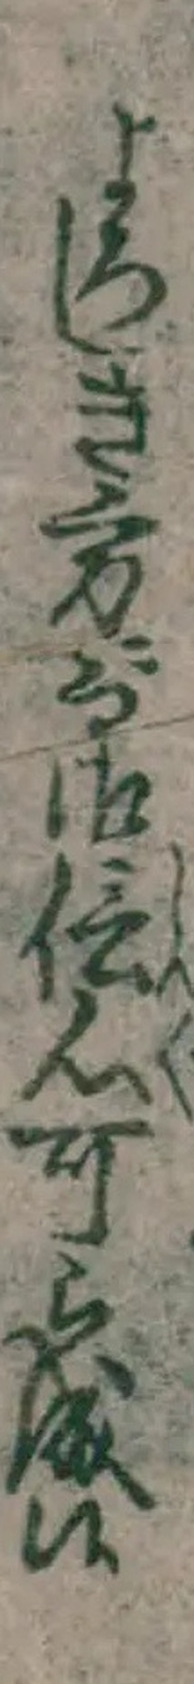よろしき方にて御信心可被成候
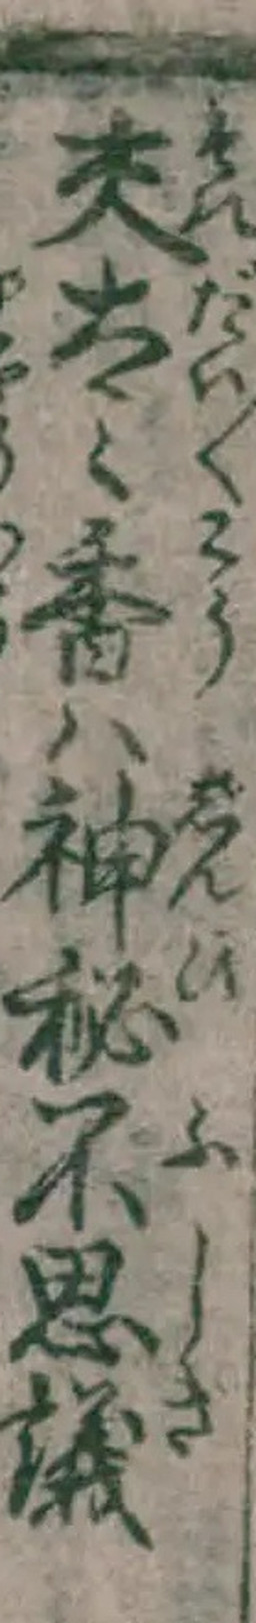夫太々香は神秘不思議
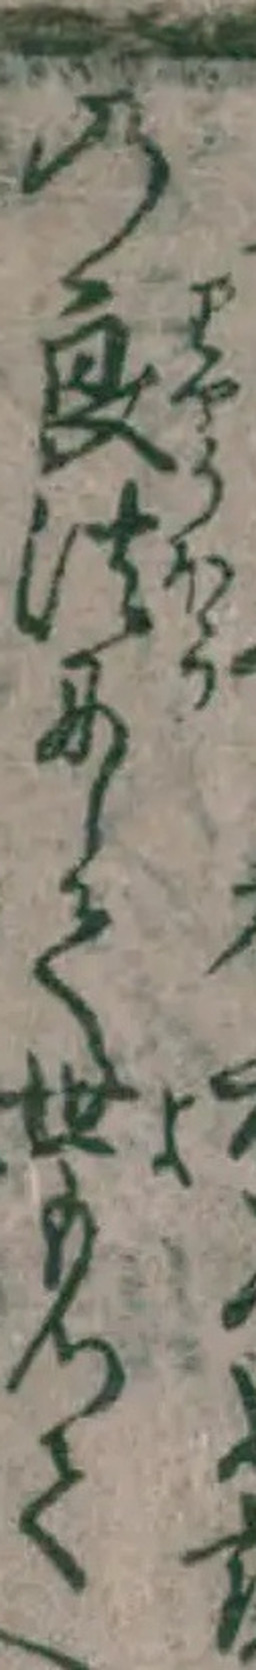の良法にして世もつて
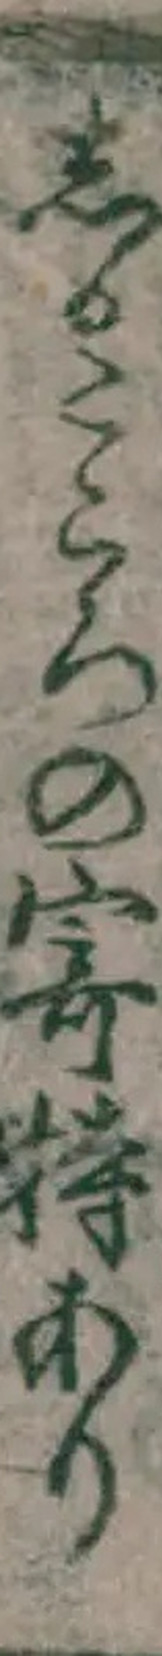しるところの寄特あり
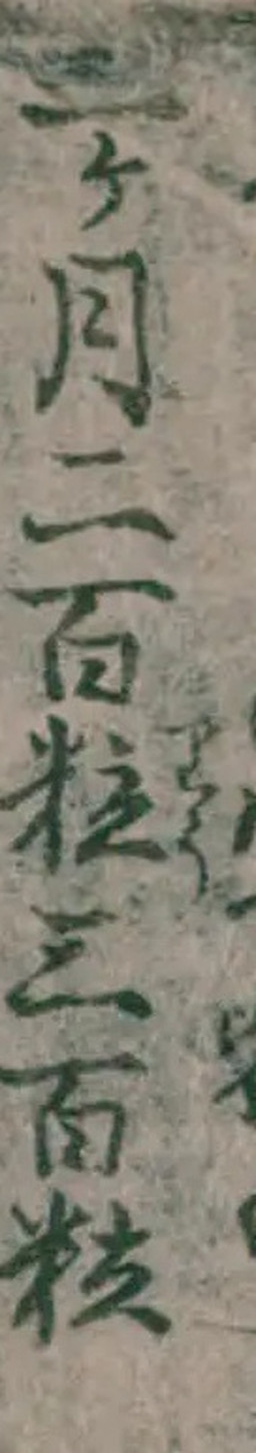一ヶ月二百粒三百粒
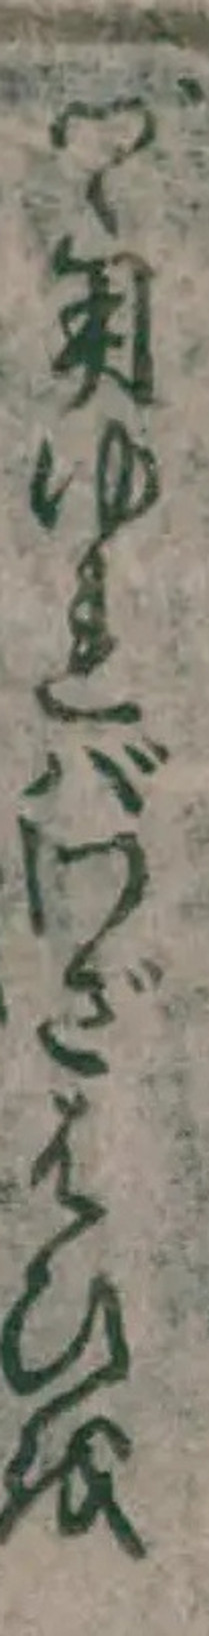づゝ用ゆればわざはひを
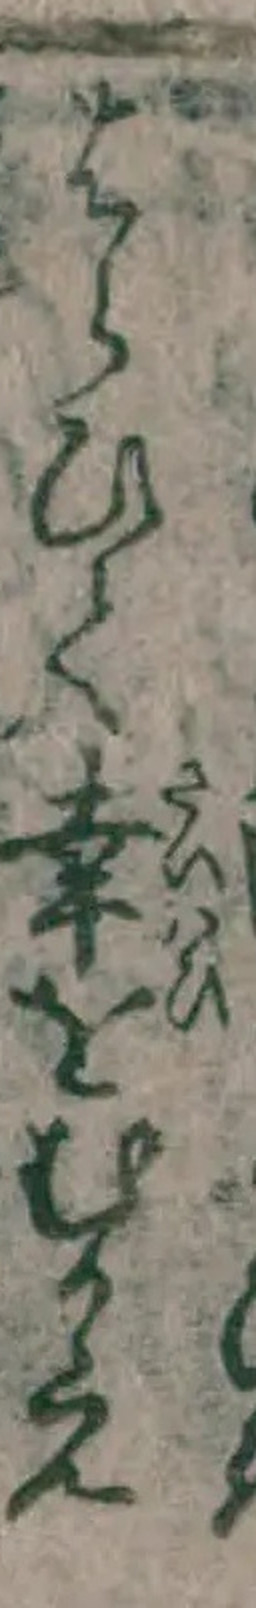はらひて幸をむかえ
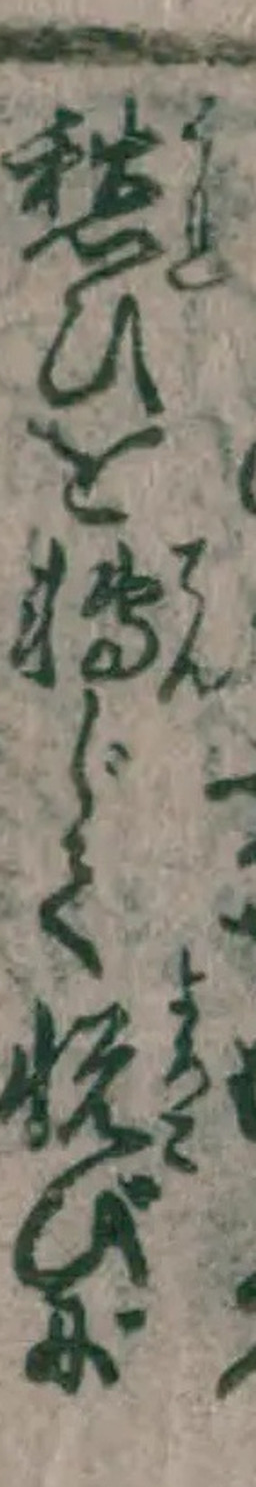愁ひを転じて悦びに
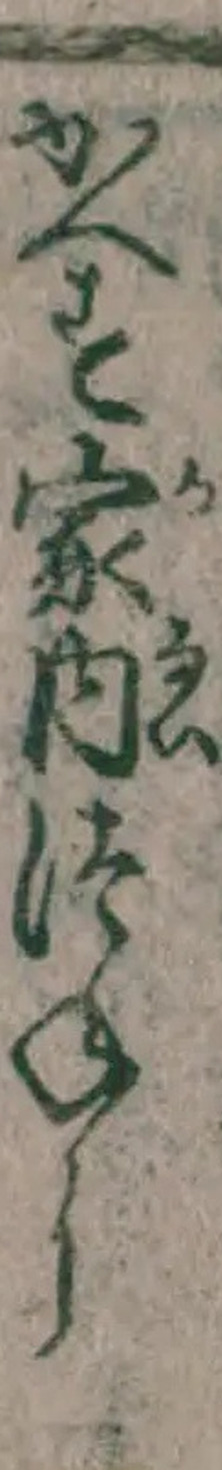かへす家内つねに
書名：視薬霞報条 3巻
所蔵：国立国会図書館 National Diet Library, JAPAN
